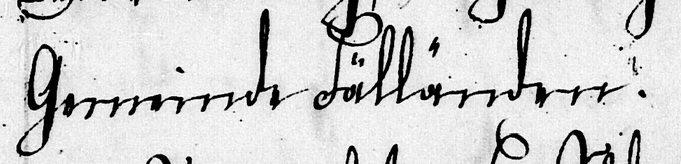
Gemeinde Fällanden.
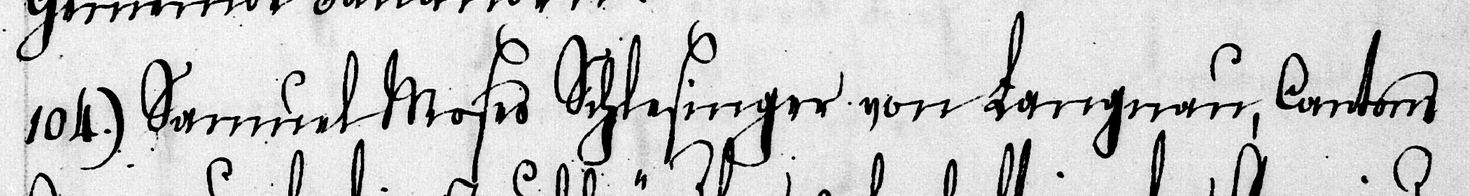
104.) Samuel Moses Schlesinger von Langnau, Cantons
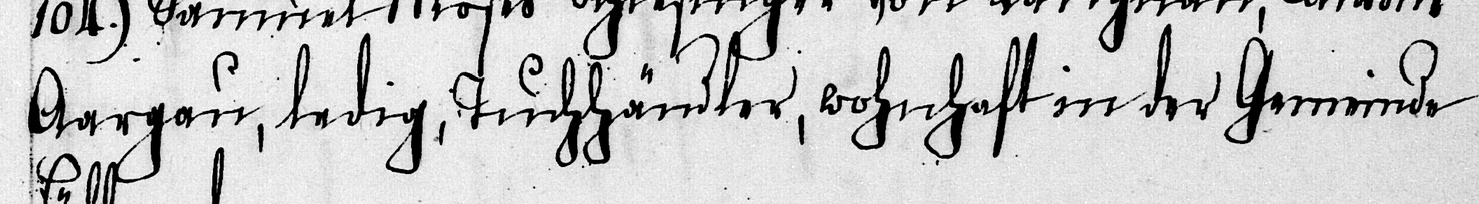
Aargau, ledig, Tuchhändler, wohnhaft in der Gemeinde
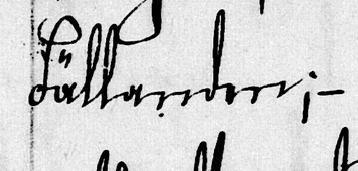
Fällanden;
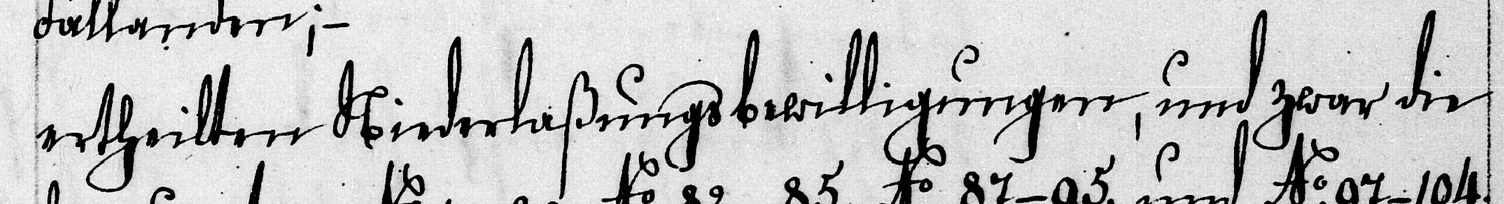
ertheilten Niederlaßungsbewilligungen, und zwar die
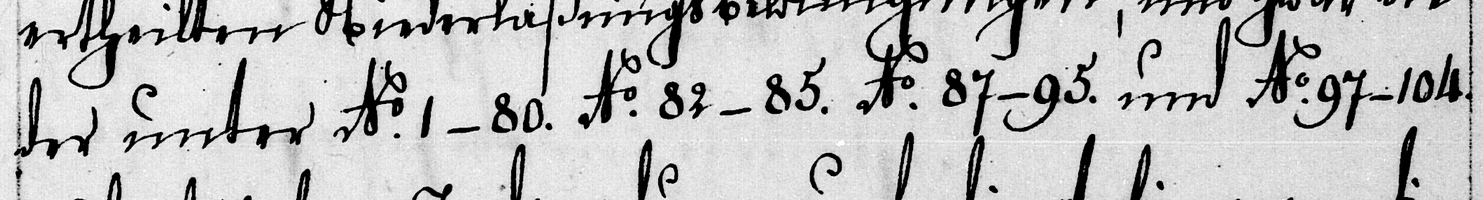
der unter No. 1 – 80. No. 82 – 85. No. 87 – 95. und No. 97 – 104.
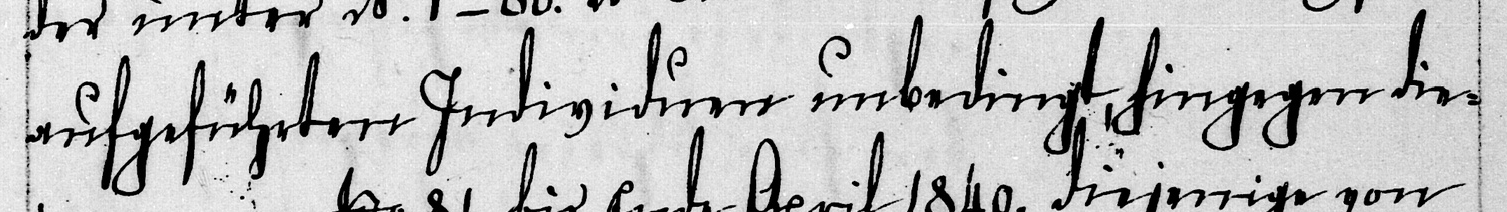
aufgeführten Individuen unbedingt, hingegen die¬
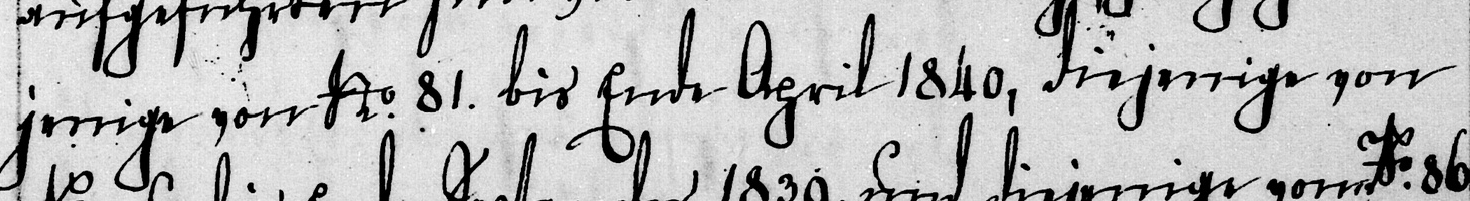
jenige von No. 81. bis Ende April 1840, diejenige von
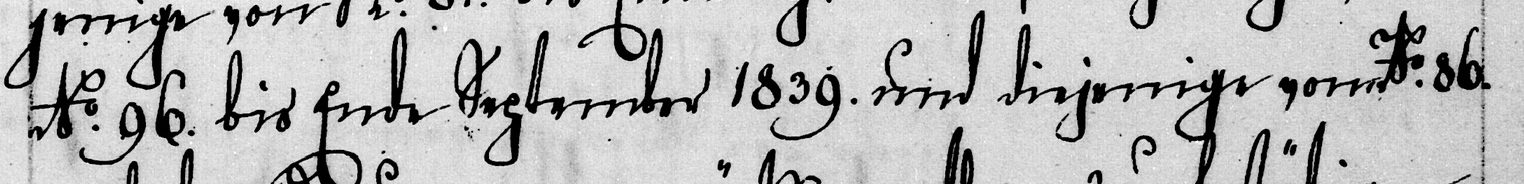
No. 96. bis Ende September 1839. und diejenige von No. 86.
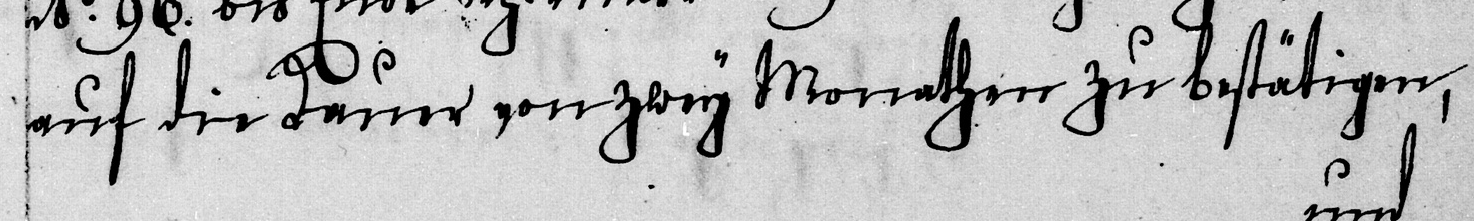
auf die Dauer von zwey Monathen zu bestätigen,
